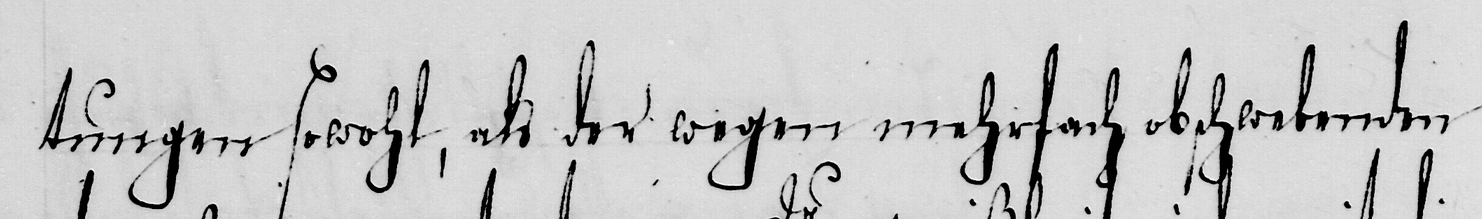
tungen sowohl, als der wegen mehrfach obschwebenden
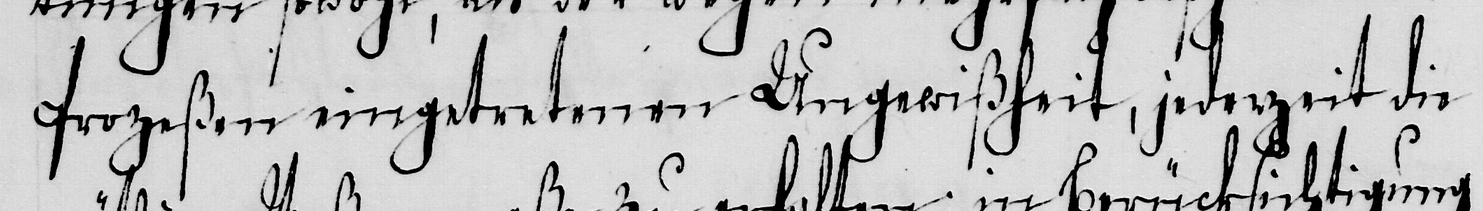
Prozeßen eingetretenen Ungewißheit, jederzeit die
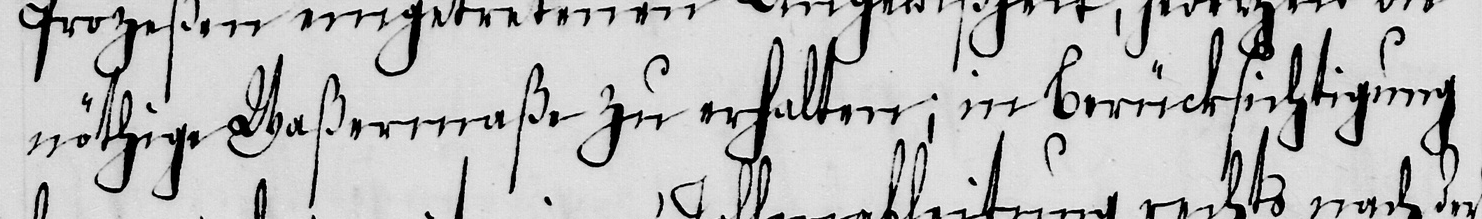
nöthige Waßermaße zu erhalten; in Berücksichtigung
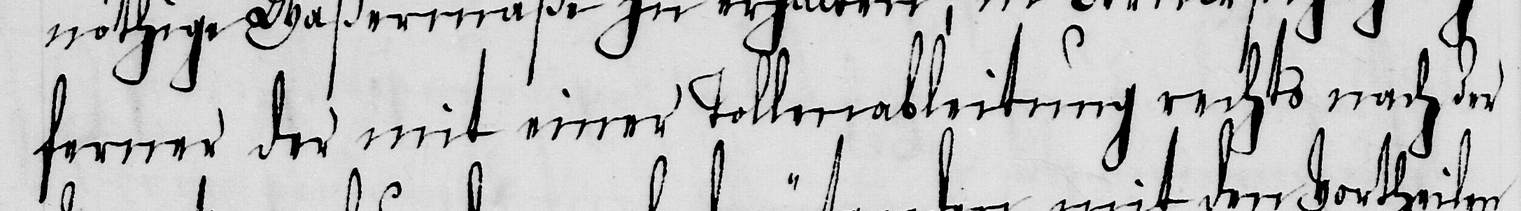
ferner der mit einer Tollenableitung rechts nach der
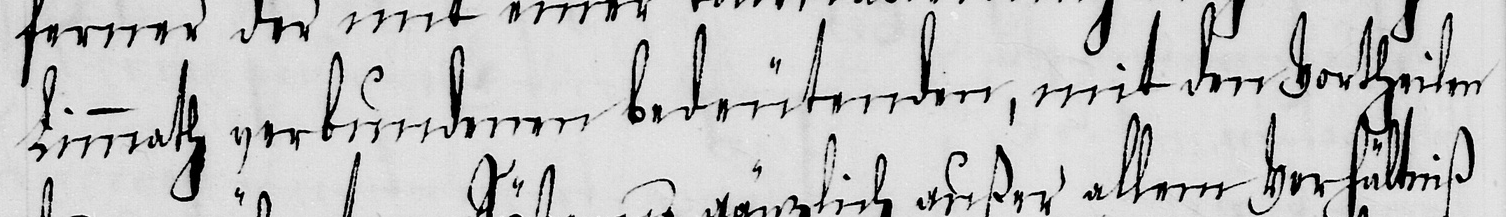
Limmath verbundenen bedeutenden, mit den Vortheilen
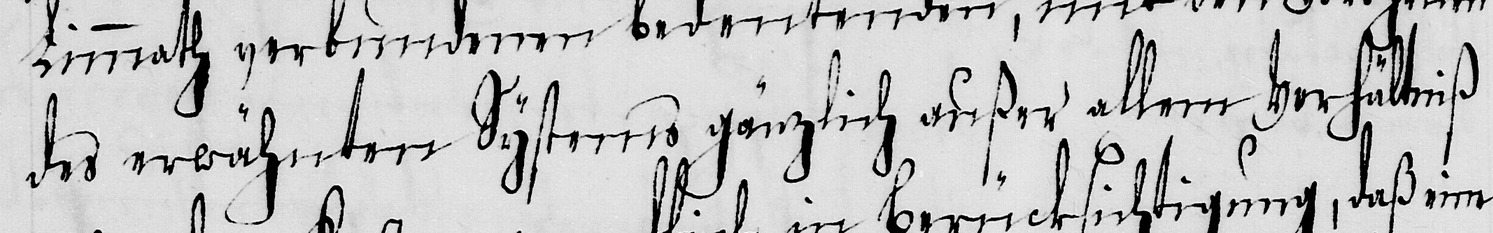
des erwähnten Systems gänzlich außer allem Verhältniß
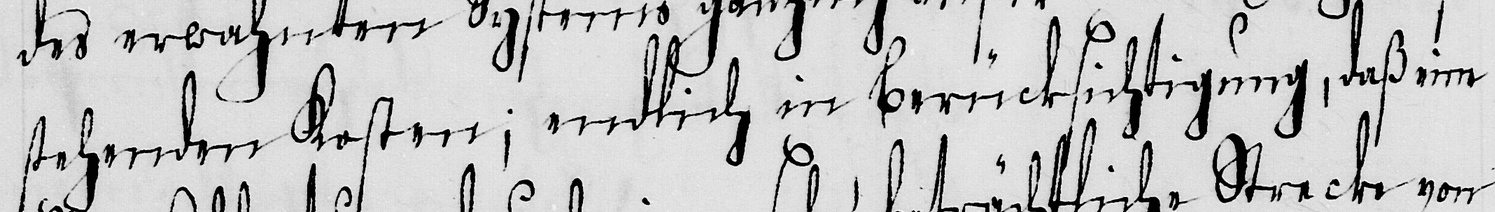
stehenden Kosten; endlich in Berücksichtigung, daß eine
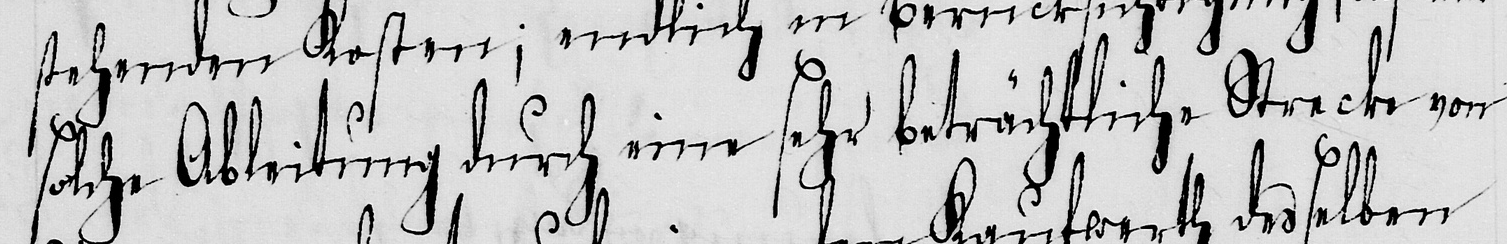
solche Ableitung durch eine sehr beträchtliche Strecke von
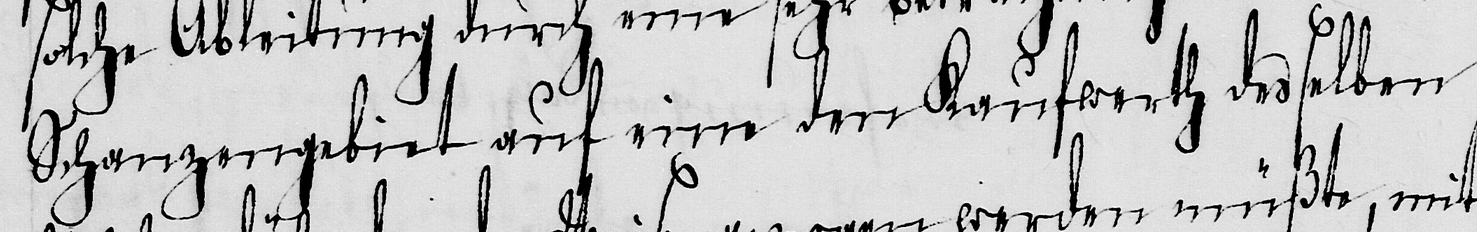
Schanzengebiet auf eine den Kaufwerth desselben
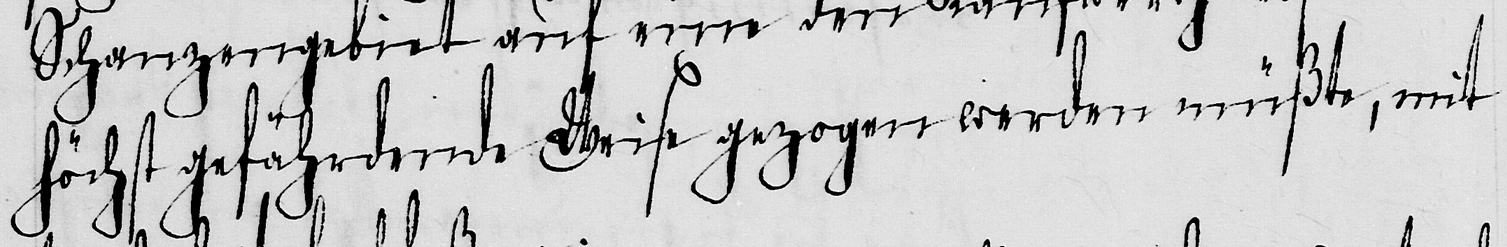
höchst gefährdende Weise gezogen werden müßte, mit
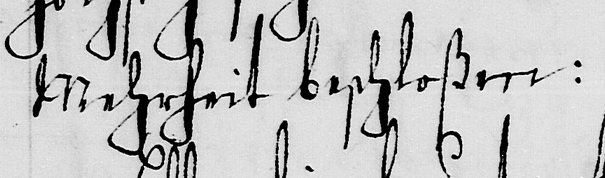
Mehrheit beschloßen:
